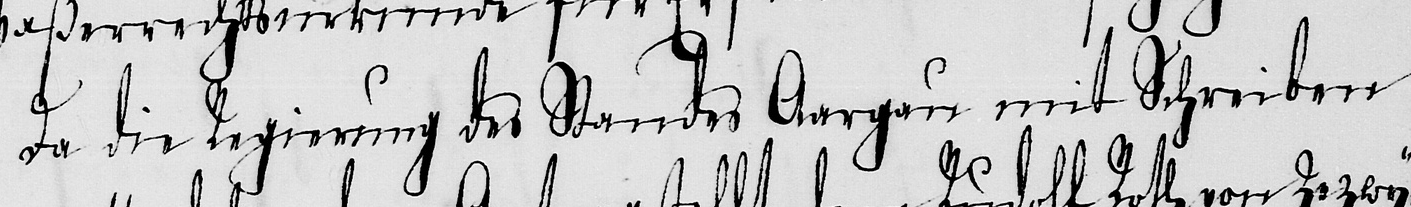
Da die Regierung des Standes Aargau mit Schreiben
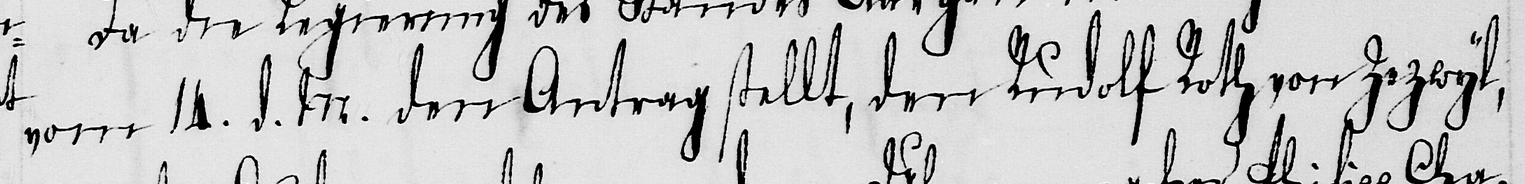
vom 14. d. M. den Antrag stellt, den Rudolf Roth von Zezwyl,
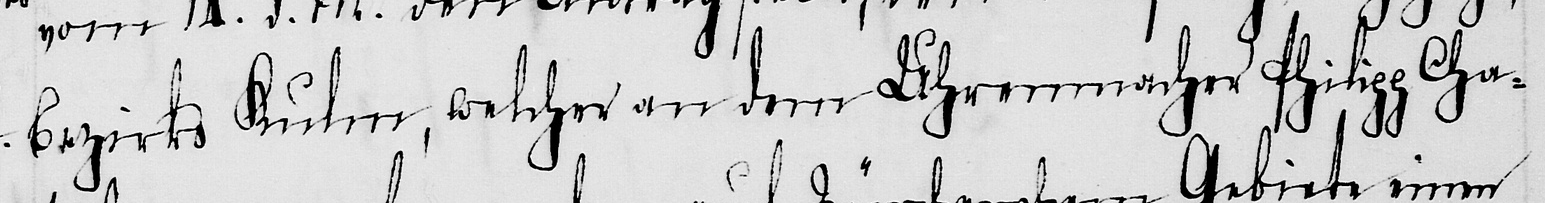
Bezirks Kulm, welcher an dem Uhrenmacher Philipp Cha¬
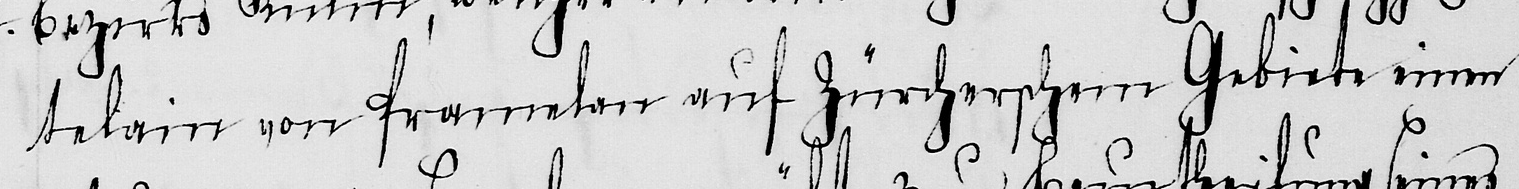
telain von Pramelan auf Zürcherschem Gebiete einen
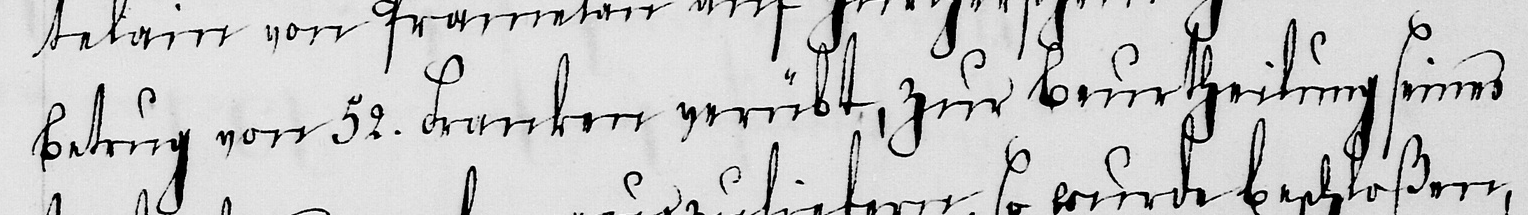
Betrug von 52. Franken verübt, zur Beurtheilung seines
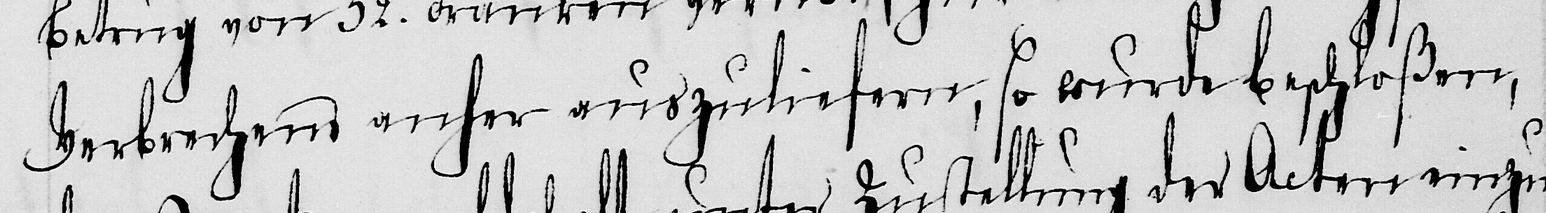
Verbrechens anher auszuliefern, so wurde beschloßen,
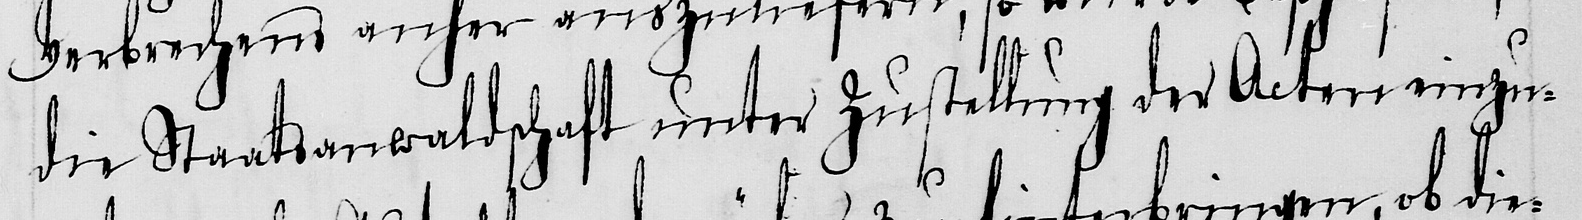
die Staatsanwaldschaft unter Zustellung der Acten einzu¬
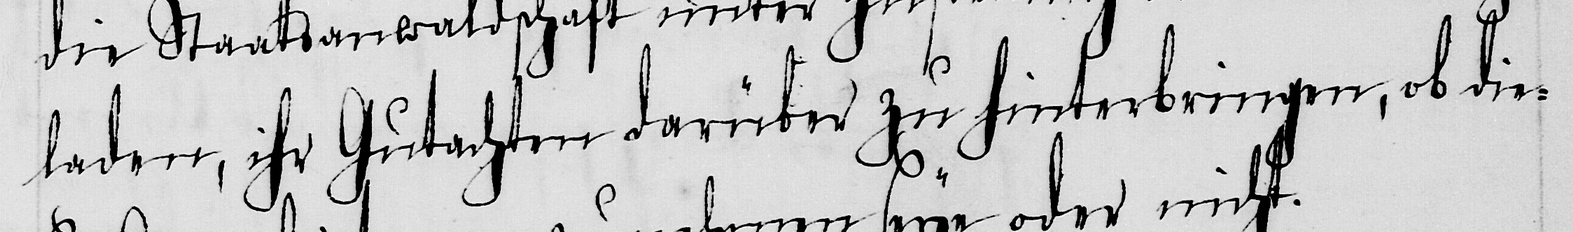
laden, ihr Gutachten darüber zu hinterbringen, ob die¬
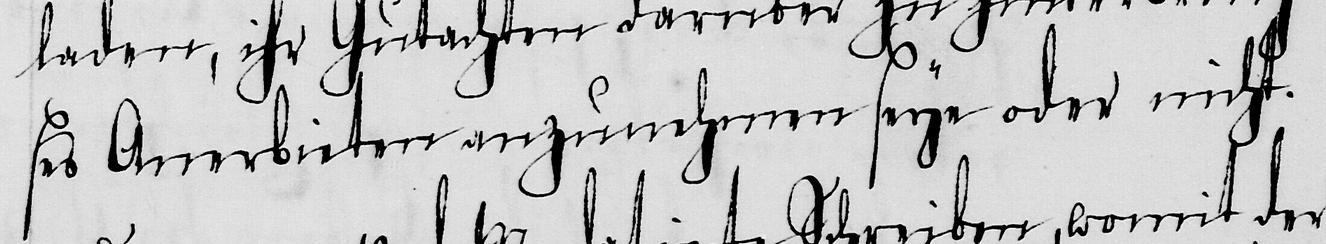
ses Anerbieten anzunehmen seye oder nicht.
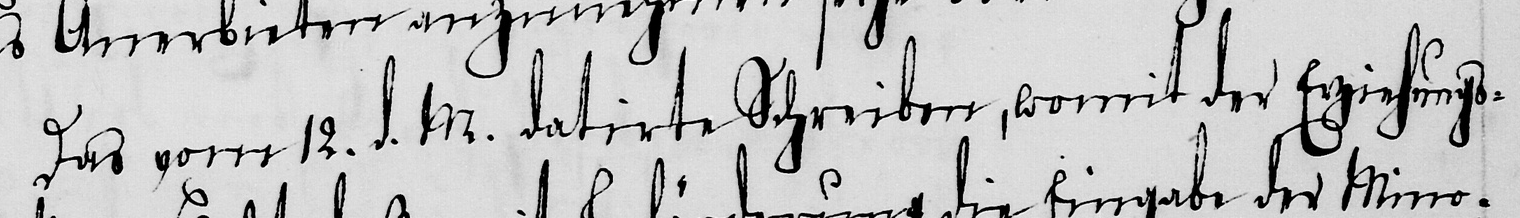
Das vom 12. d. M. datirte Schreiben, womit der Erziehungs¬
